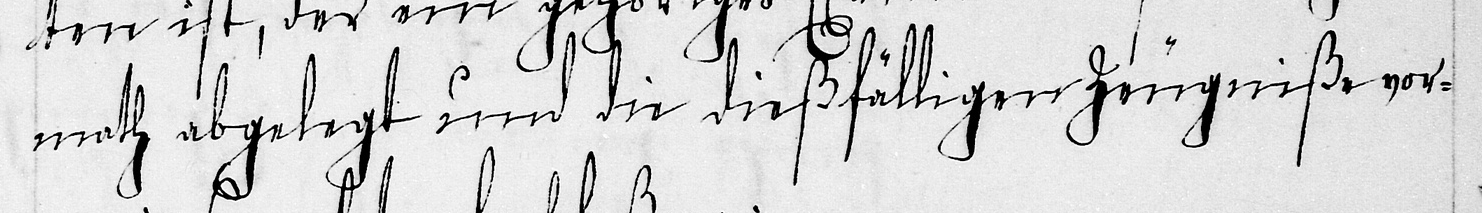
math abgelegt und die dießfälligen Zeugniße vor¬
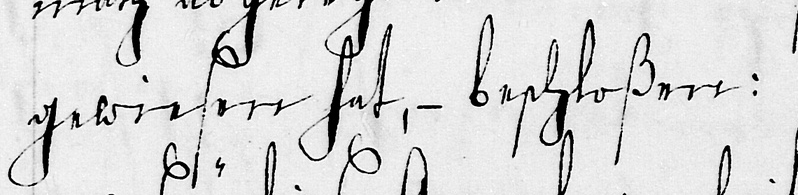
gewiesen hat, – beschloßen:
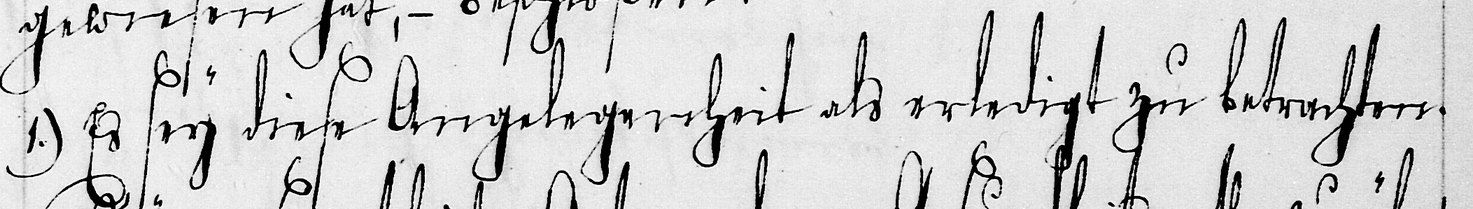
Es sey diese Angelegenheit als erledigt zu betrachten.
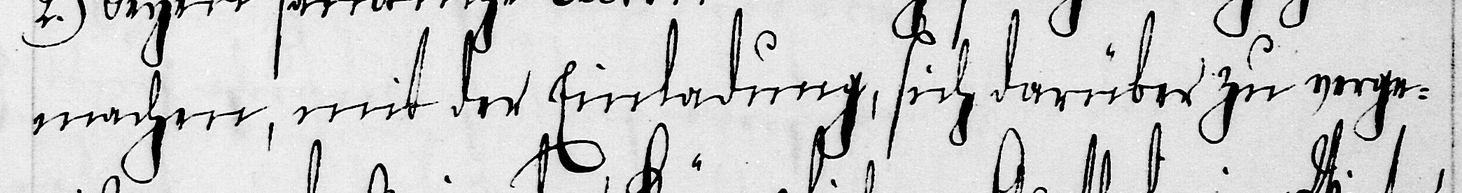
rmachen, mit der Einladung, sich darüber zu verge¬
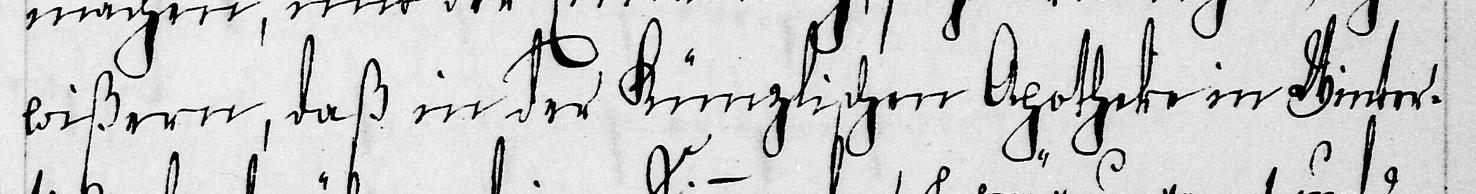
wißern, daß in der Künzlischen Apotheke in Winter¬
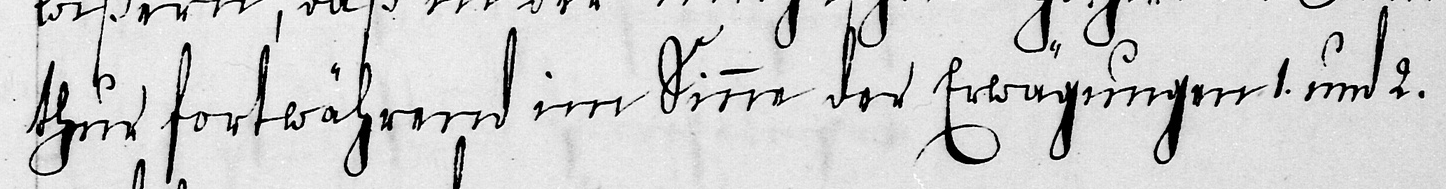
thur fortwährend im Sinne der Erwägungen 1. und 2.
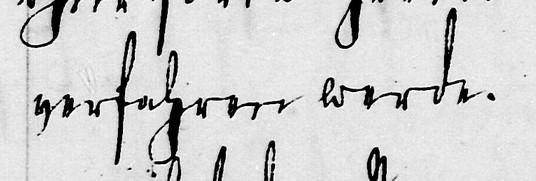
verfahren werde.
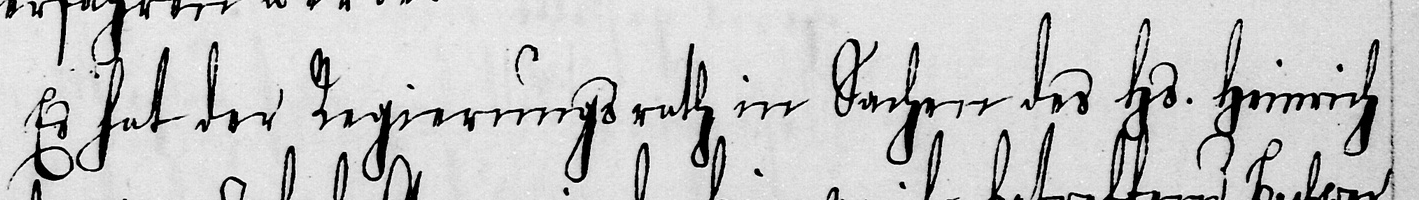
Es hat der Regierungsrath in Sachen des Hs. Heinrich
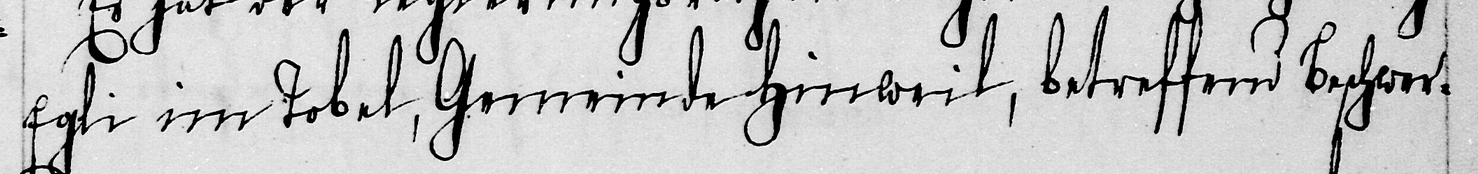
Egli im Tobel, Gemeinde Hinweil, betreffend Beschwer-
